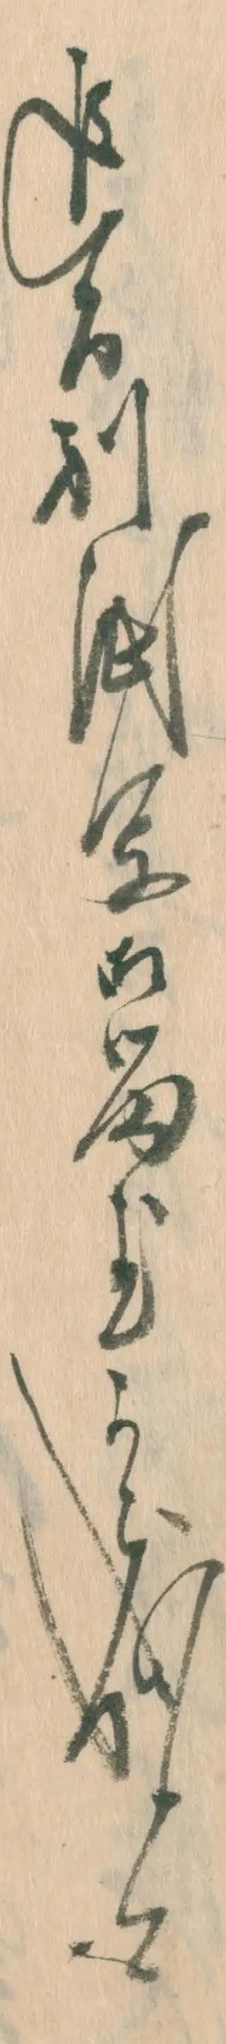追て別紙写御留置可被成候以上
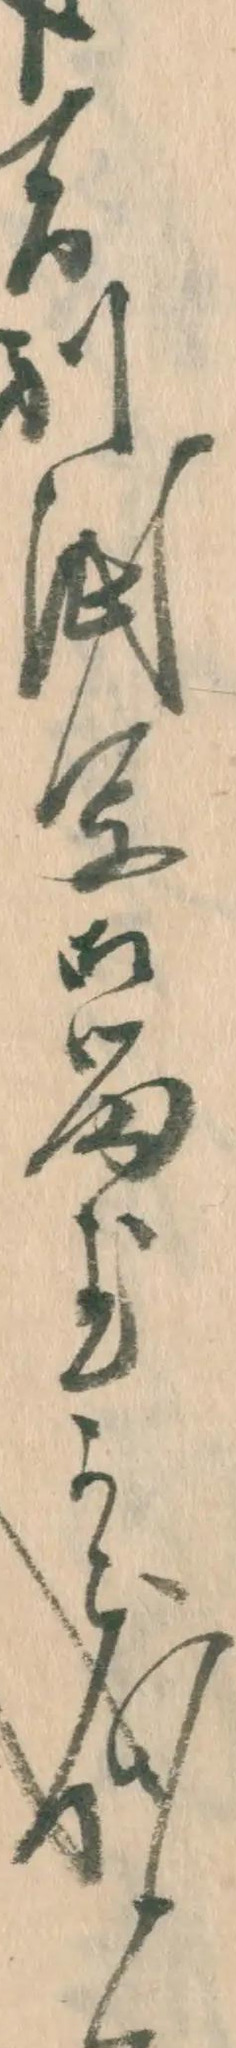追て別紙写御留置可被成候以上
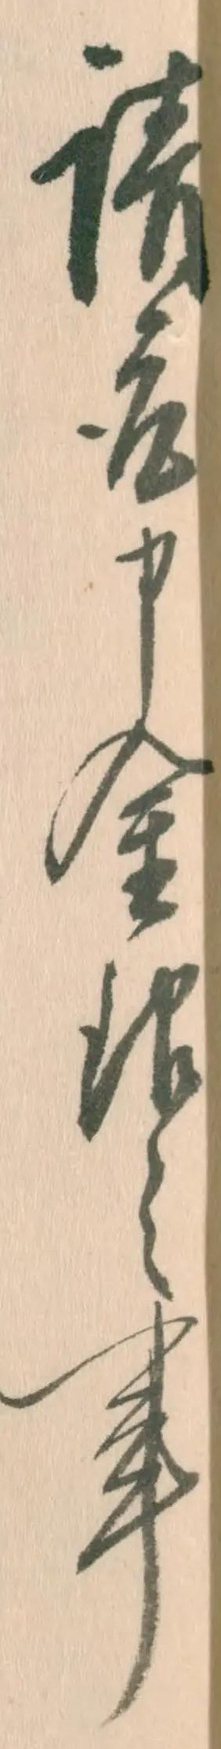請取申金銀之事
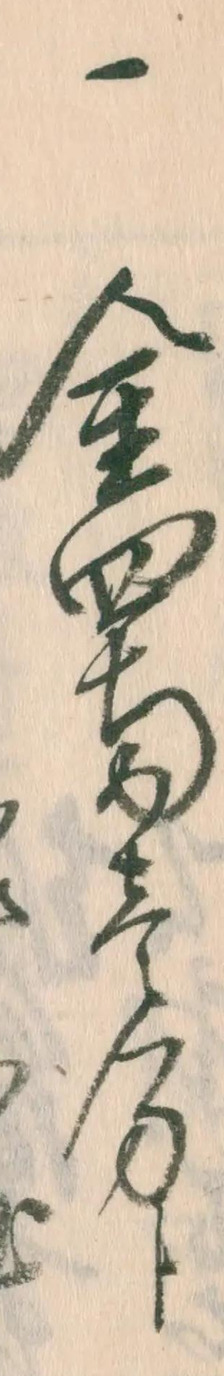一金四両壱分ト
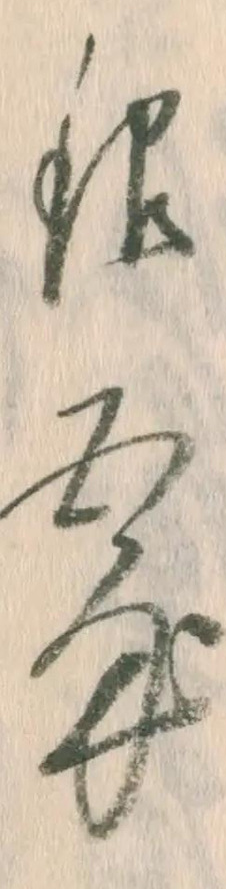銀五匁
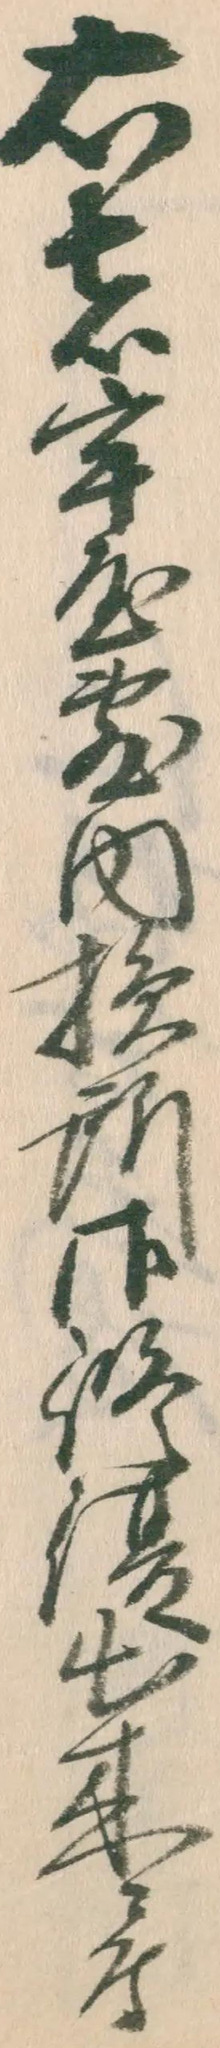右は牢屋敷内損所御修復出来ニ付
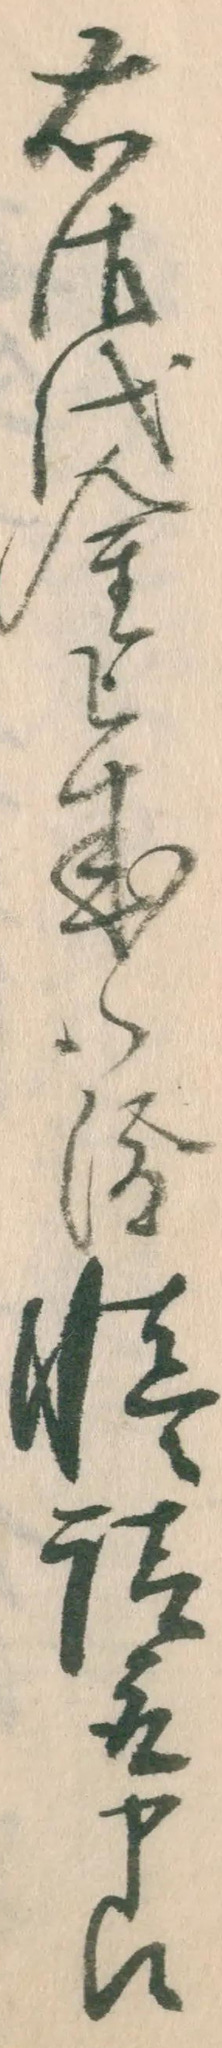右御代金被成御渡慥ニ請取申候
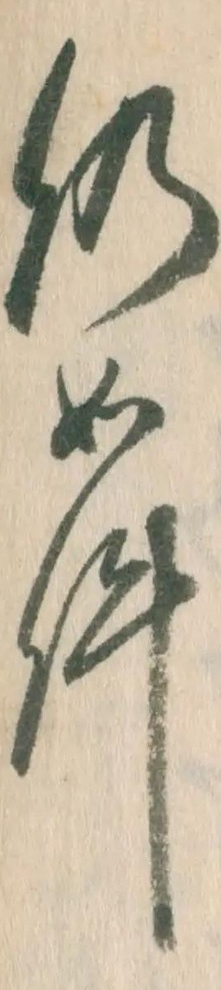仍如件

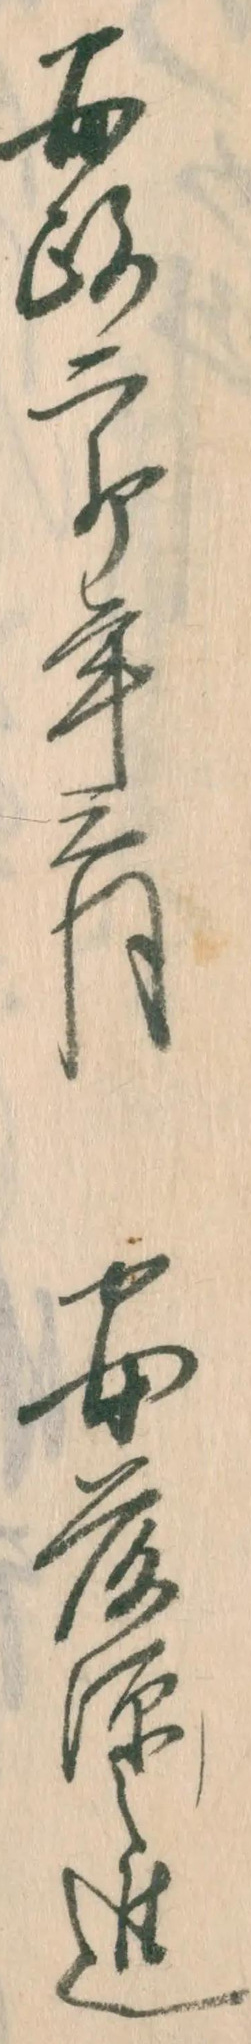安政二卯年三月安藤源之進
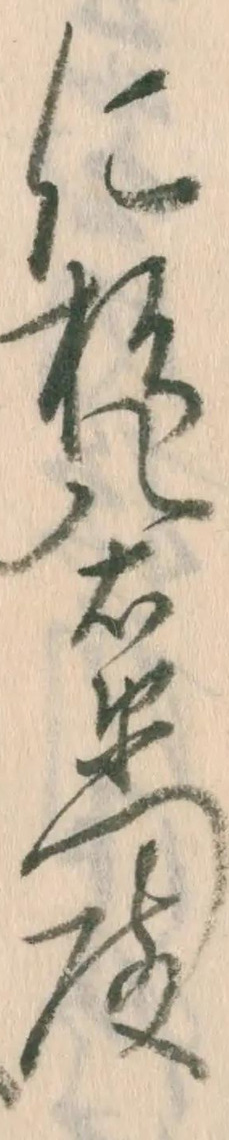仁杉八右衛門殿
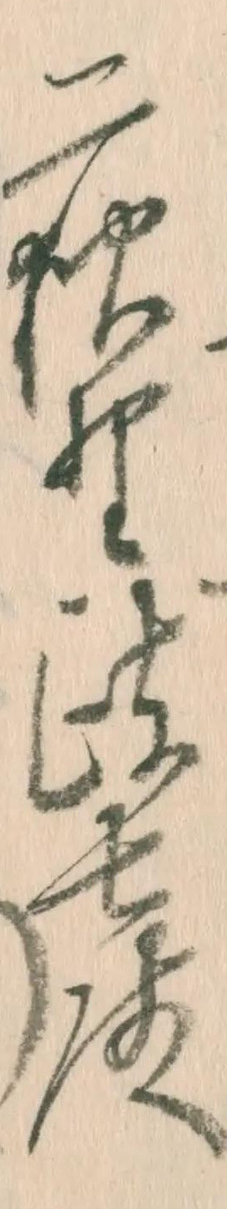荻野政七殿
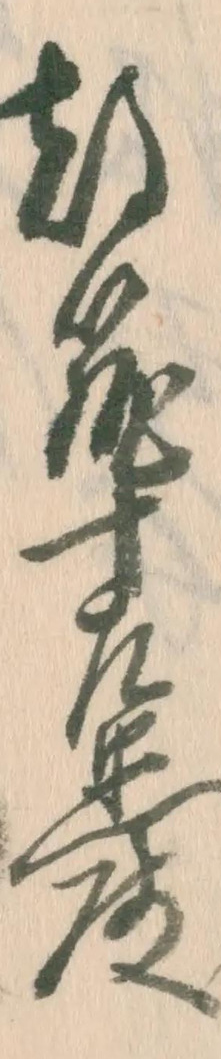都筑十左衛門殿
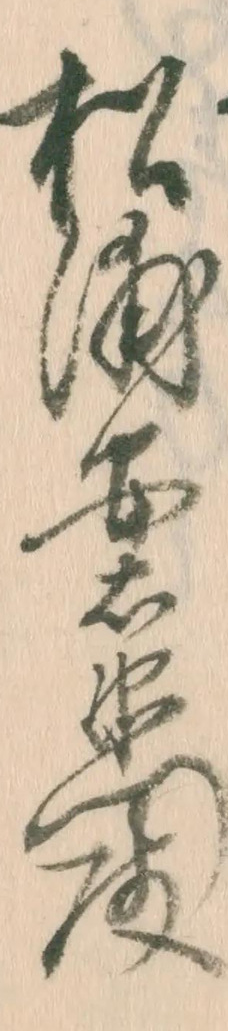松浦安右衛門殿様
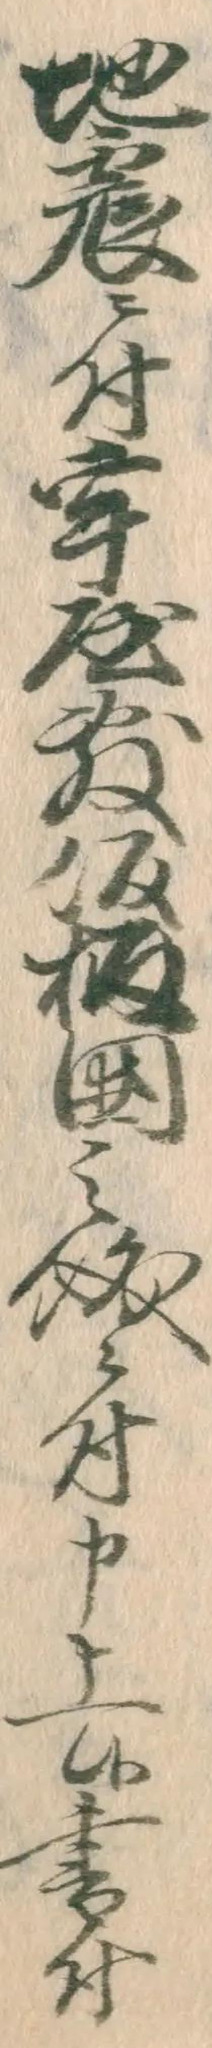│地震ニ付牢屋敷仮板囲之儀ニ付申上候書付
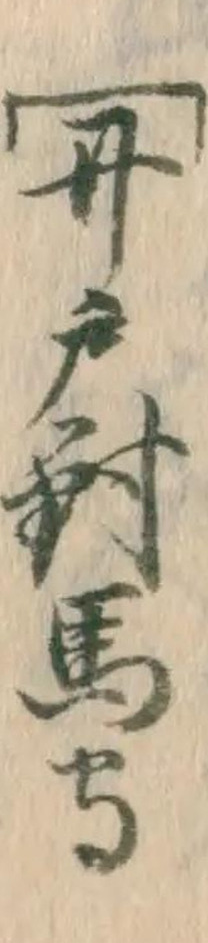│[井戸対馬守
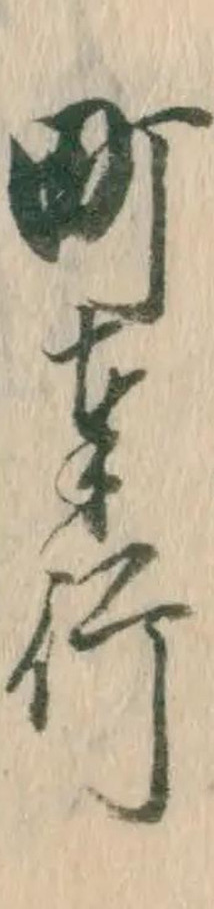│町奉行
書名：七十冊物類集 71巻. [44] 四十三 牢屋敷御普請御修覆地震ニ付骨折候牢屋掛御褒美之部
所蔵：国立国会図書館 National Diet Library, JAPAN
